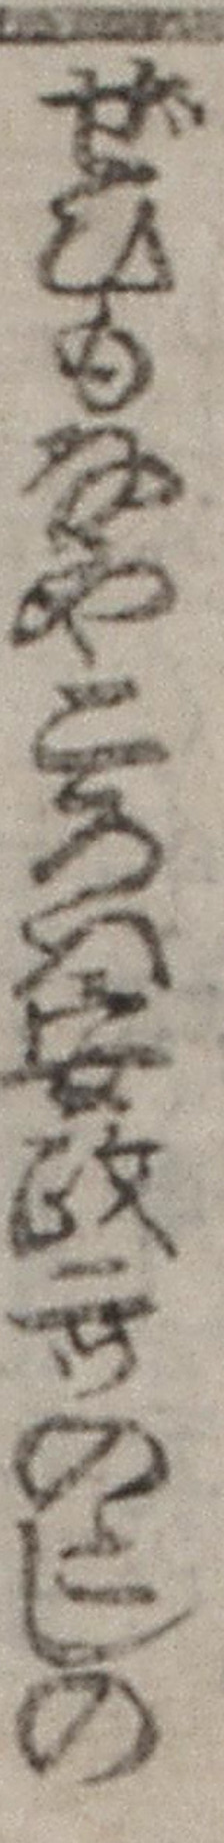ぜひもなやころは安政二ツのとしの
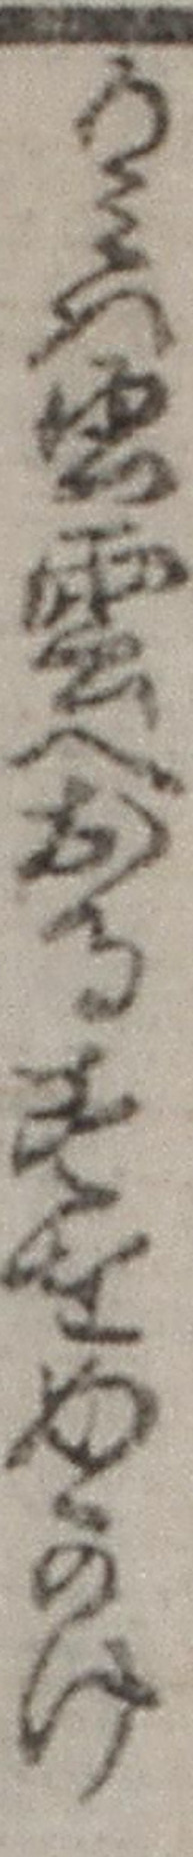かみは出雲へおるすをめかけ
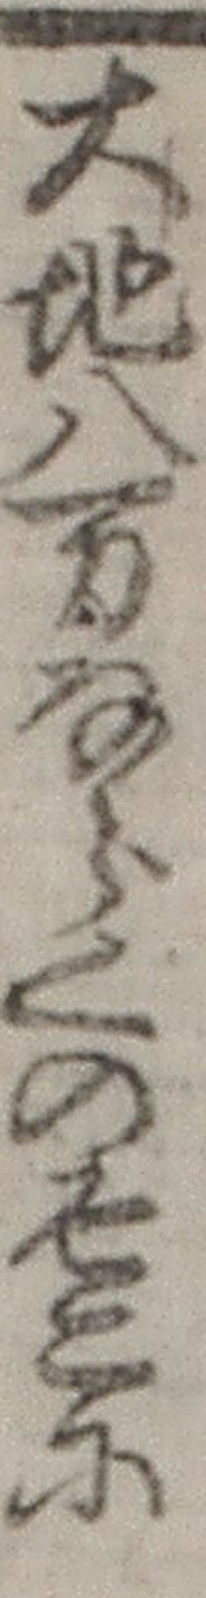大地八万ならくのそこに
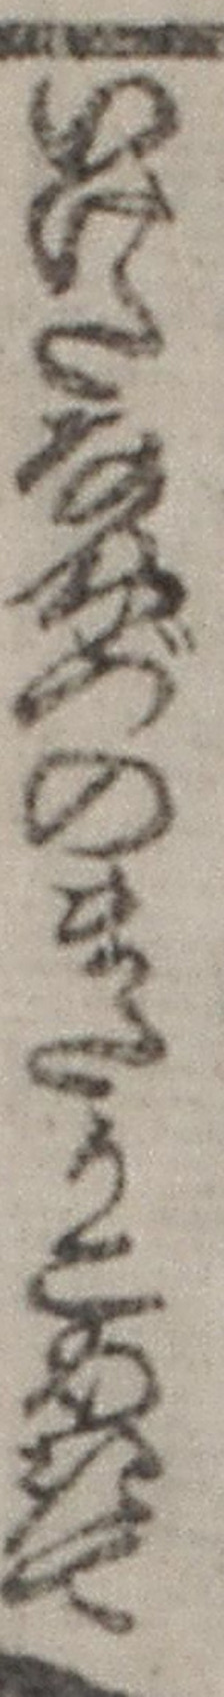いけたなまづのまたうこめきて
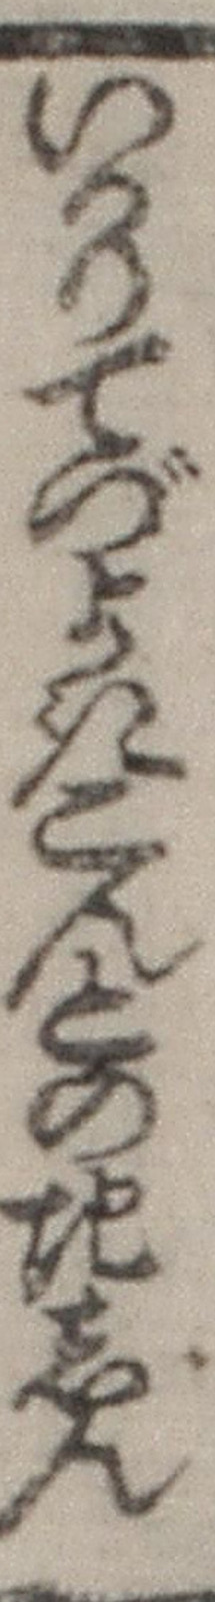いかりてづよきこんとの地しん
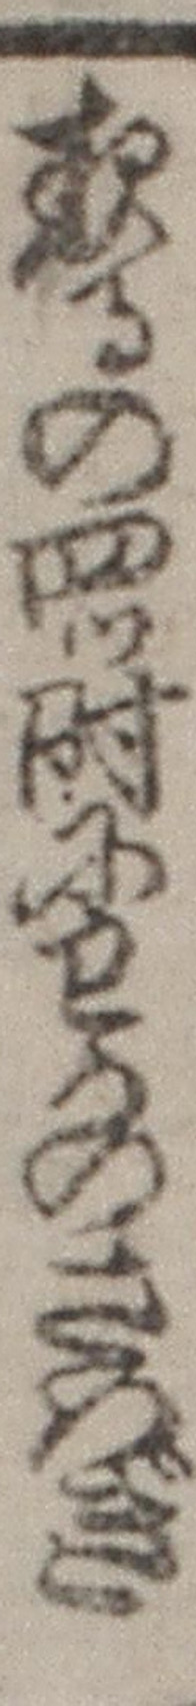夜るの四ツ時にわかのさはぎ
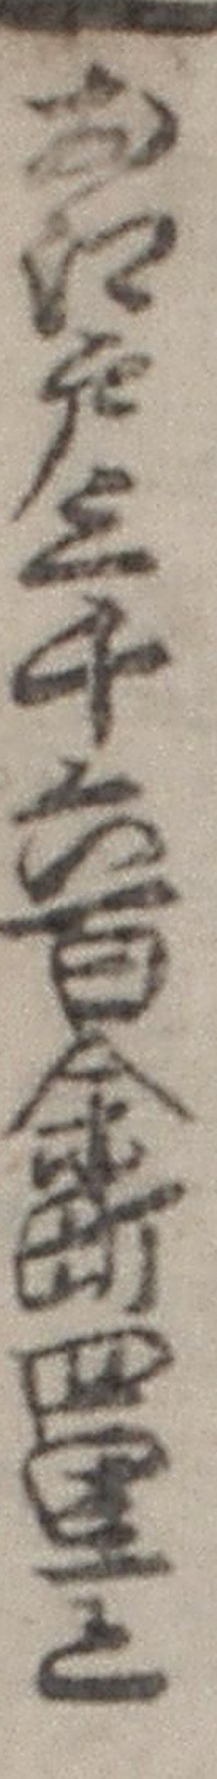お江戸三千六百余町四里と
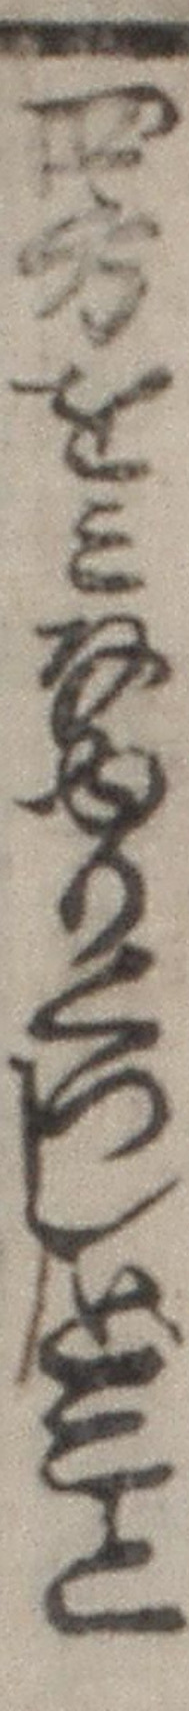四方をみなゆりくつしとこと
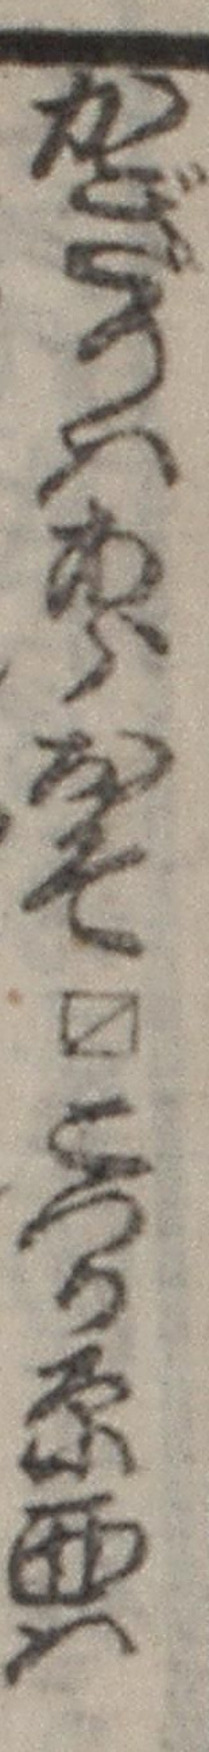かぎりはあらおそ◇こつか原西は
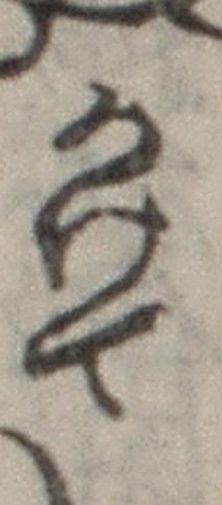かけて
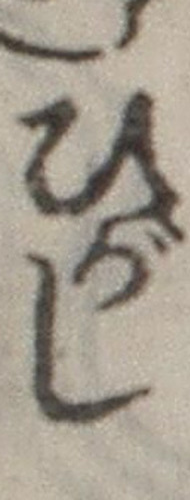ひがし
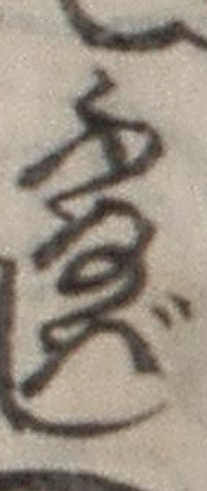ふなばし
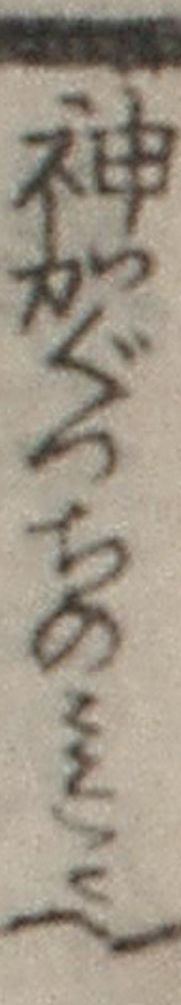神かぐつちのみこと
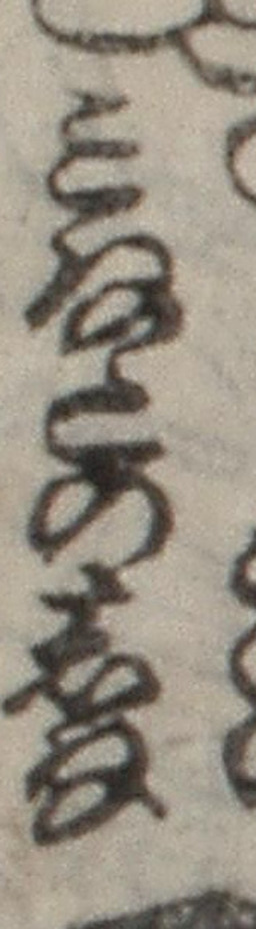みなとのしま
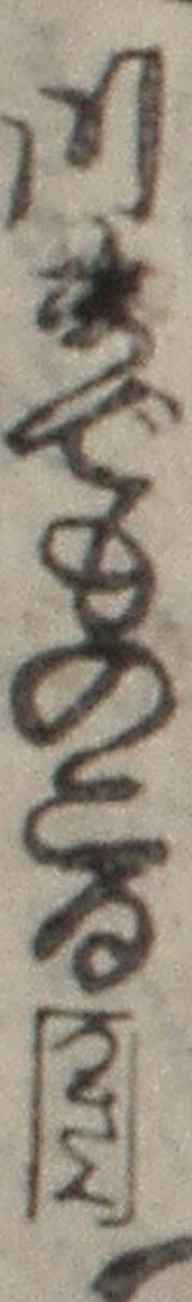川までものこるつぎへ

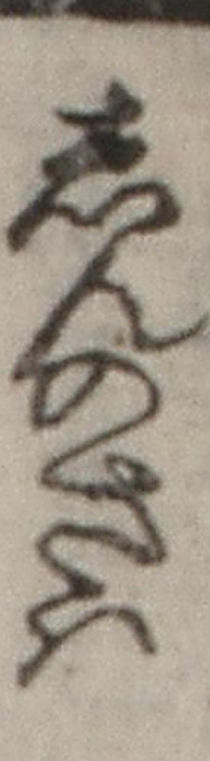しんのさは
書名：安政二卯年　江戸大地震并出火附
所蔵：東京大学地震研究所図書室 Earthquake Research Institute Library, The University of Tokyo, JAPAN
